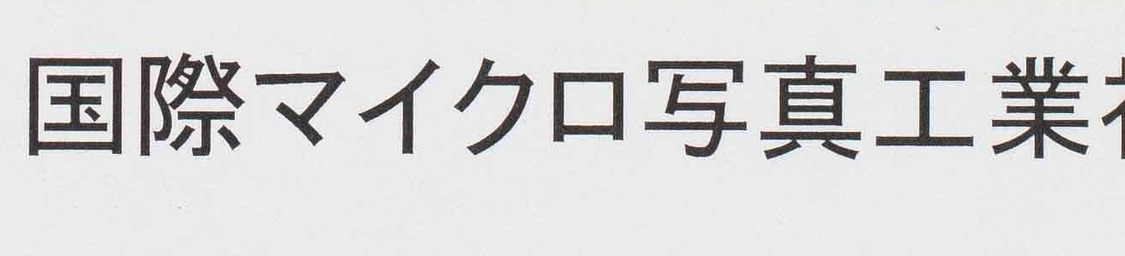マイクロ写真工業社
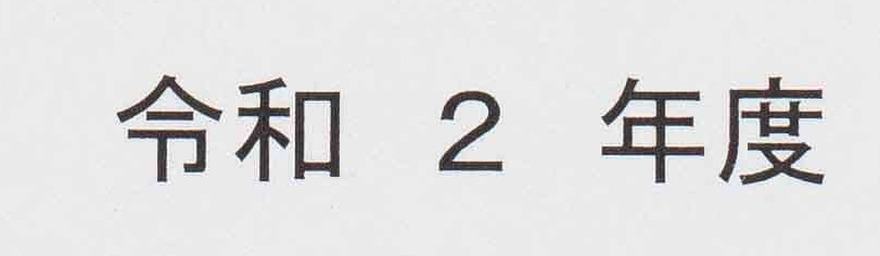令和２年度
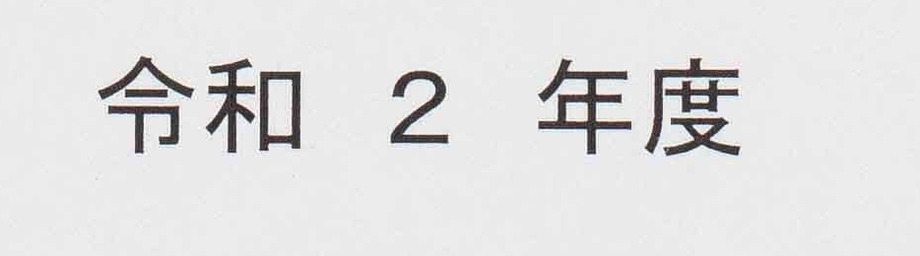令和２年度
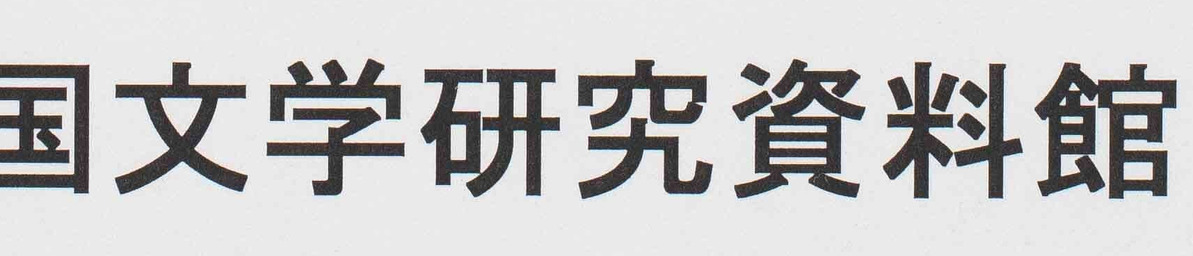国文学研究資料館

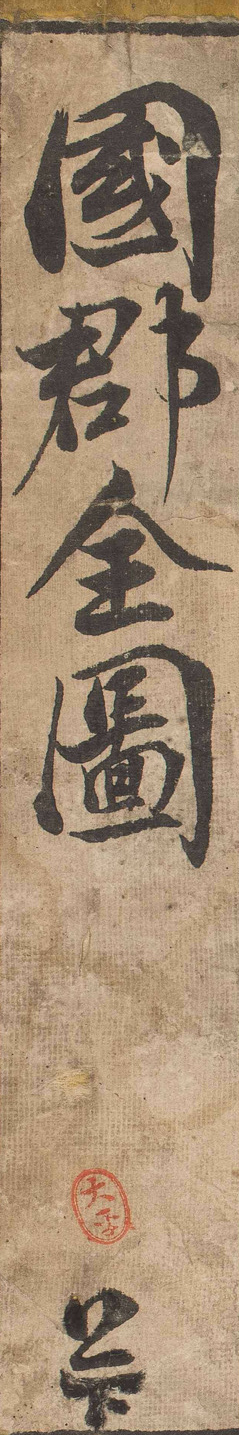国郡全図上下

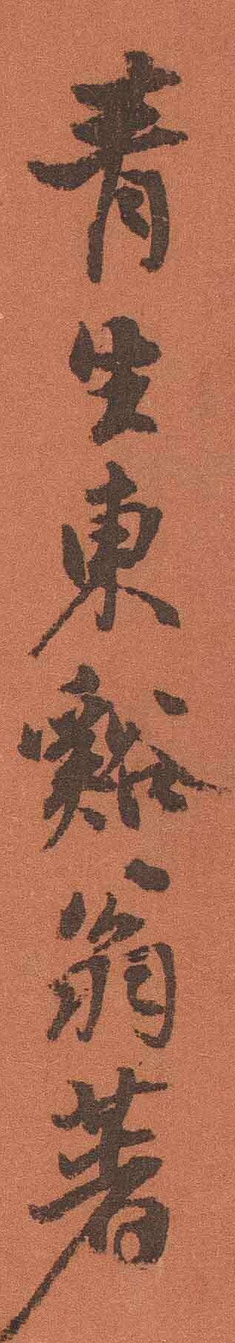青生東渓谿翁著
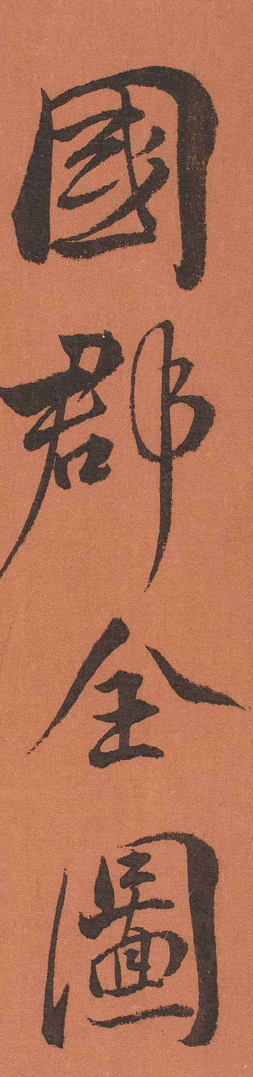国郡全図

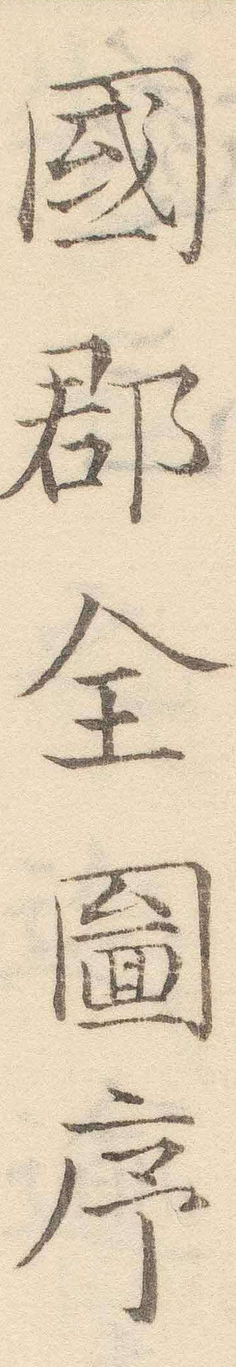国郡全図序
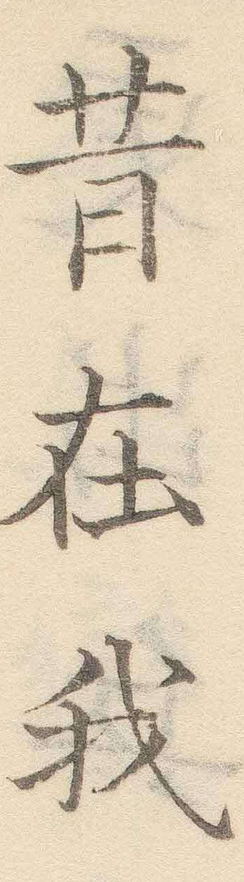昔在我
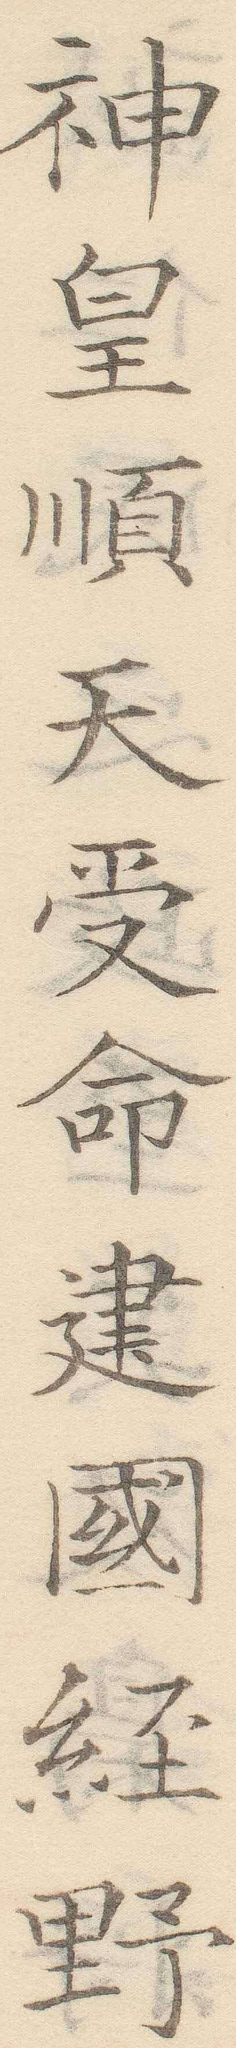神皇順天受命建国経野
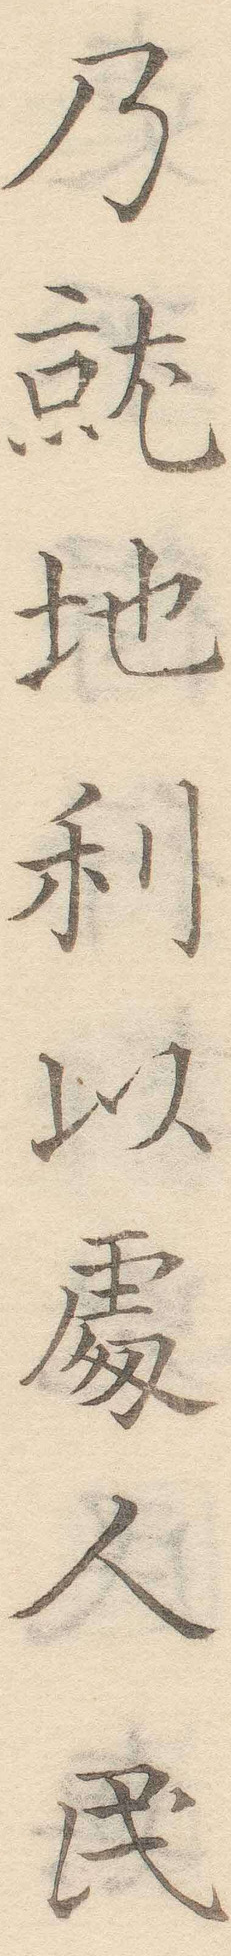乃就地利以処人民
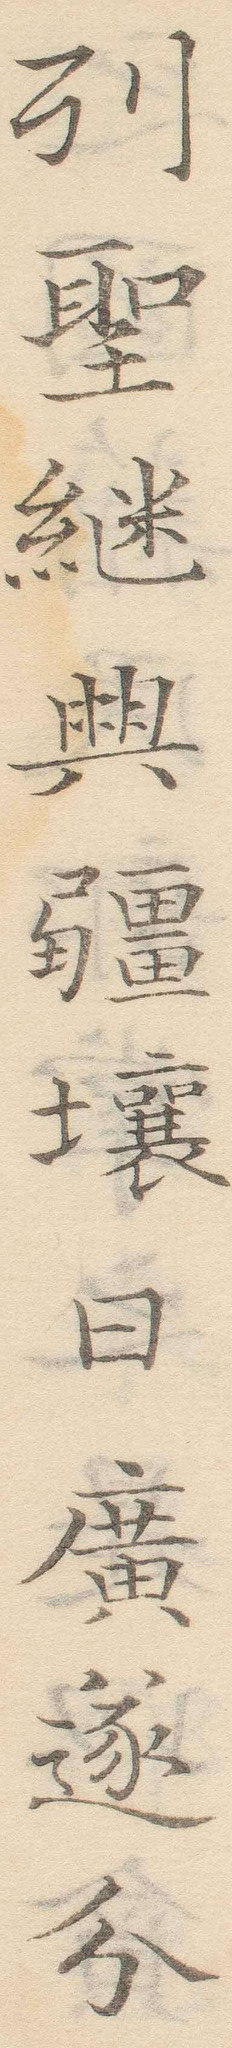列聖継典彊壌曰広遂分
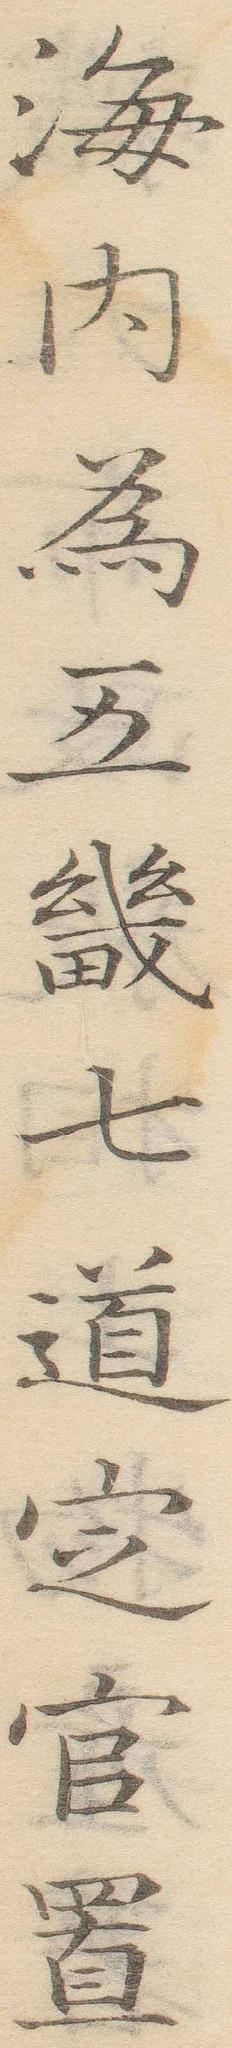海内為五畿七道定官置

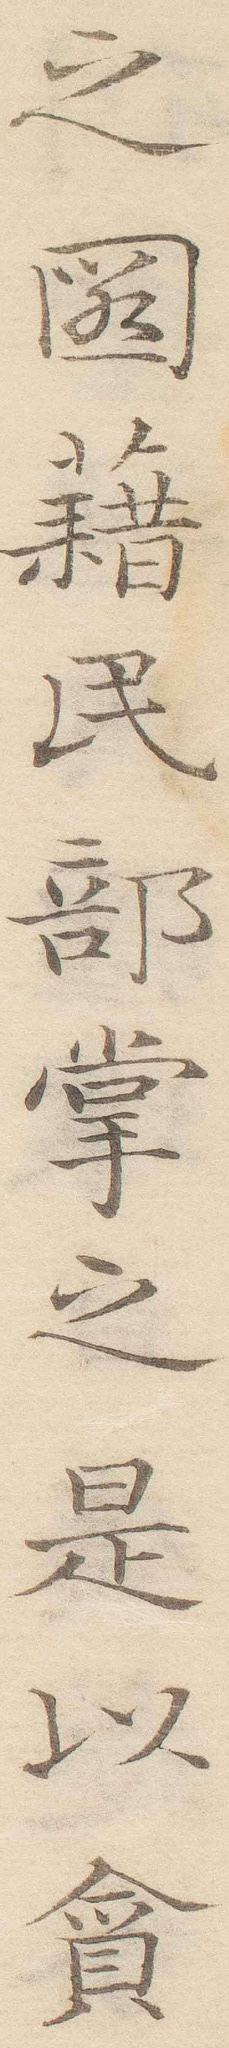之図籍民部掌之是以貪
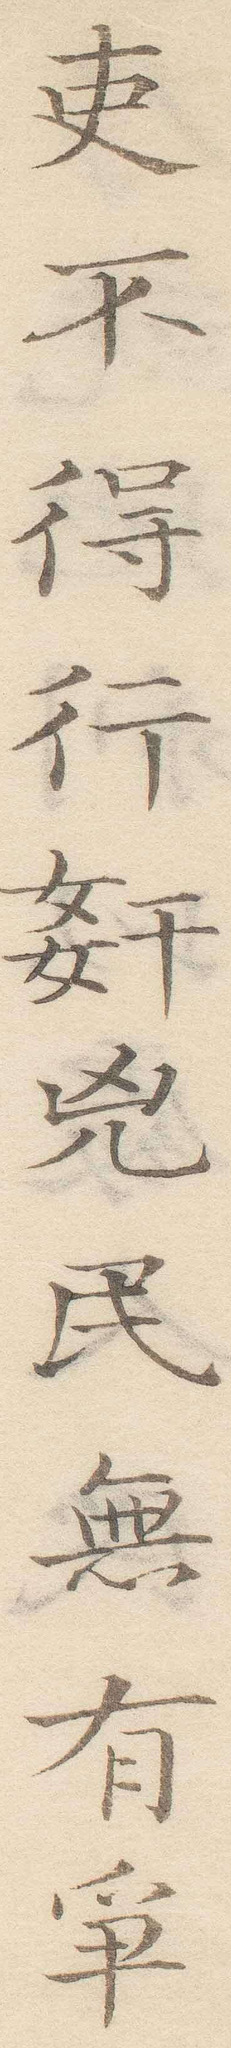吏不得行奸兇民無有争
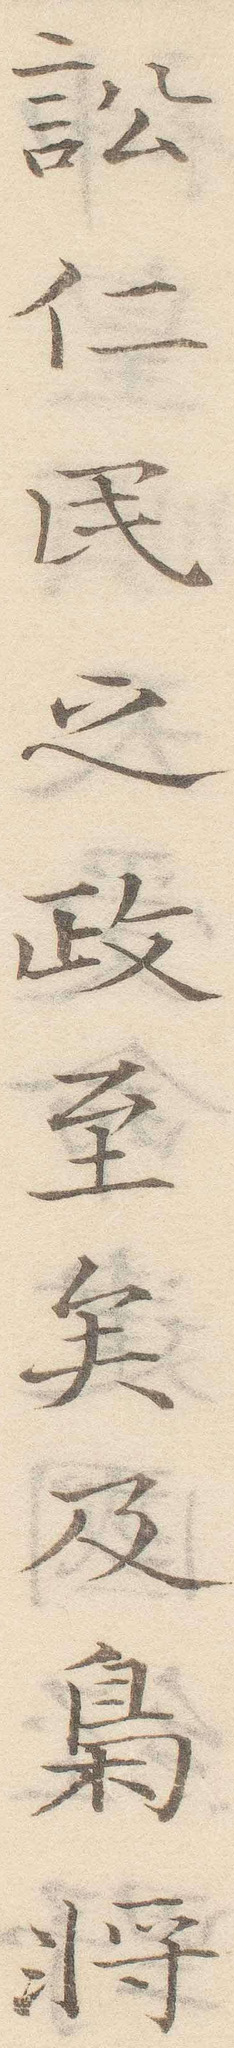訟仁民之政至矣及梟将
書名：国郡全図
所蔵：東京学芸大学附属図書館 国文学研究資料館
